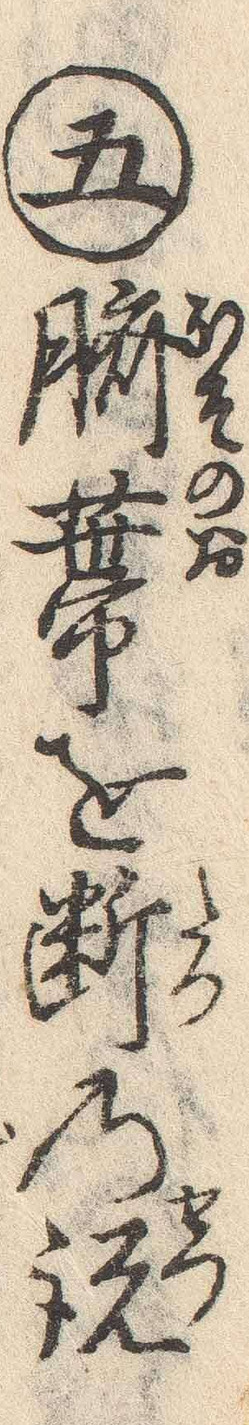㊄臍蔕を断の説
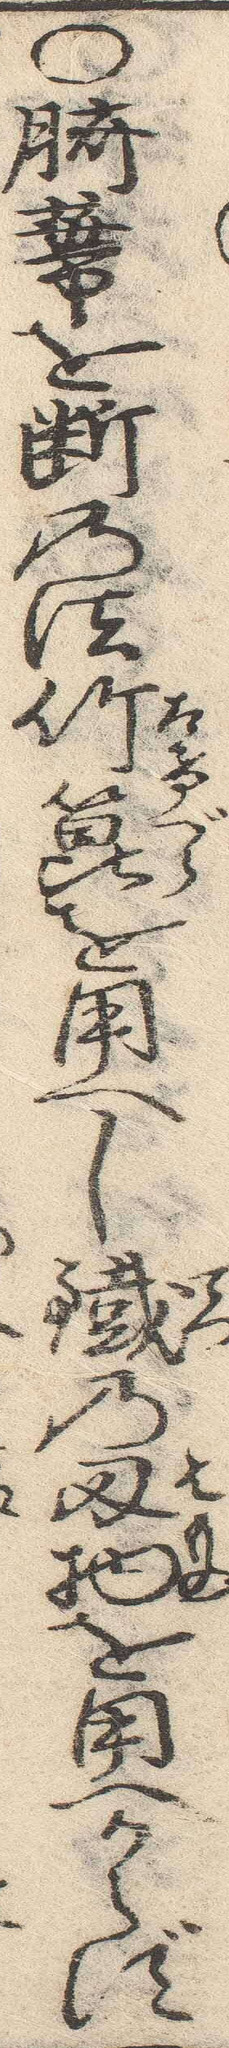◯臍蔕を断の法竹篦を用へし鐡の刃物を用へからず
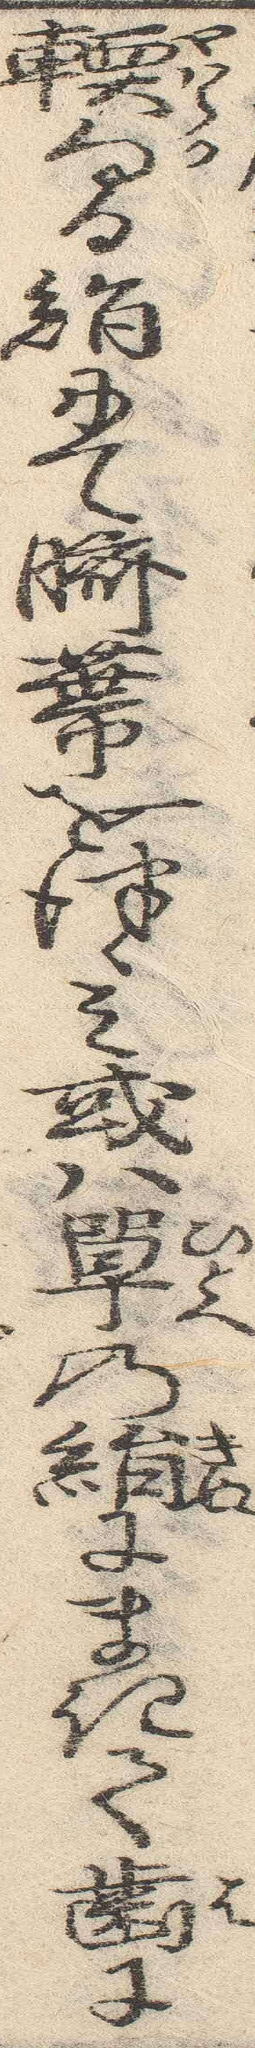輭なる絹にて臍蔕をつゝみ或は單の絹にまきて歯に
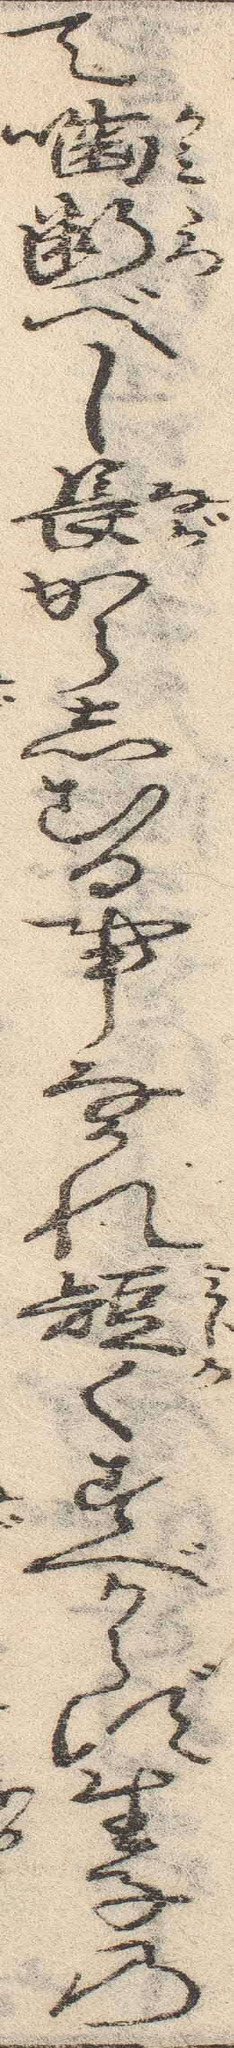て噛断べし長からしむる事なかれ短くすべからず生子の
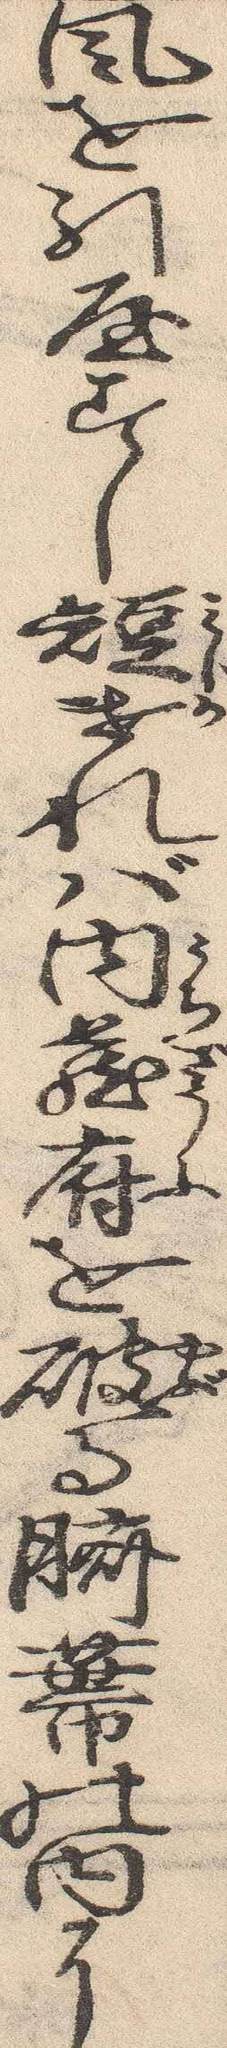風を引やすし短ければ内臓府を破る臍蔕の内に
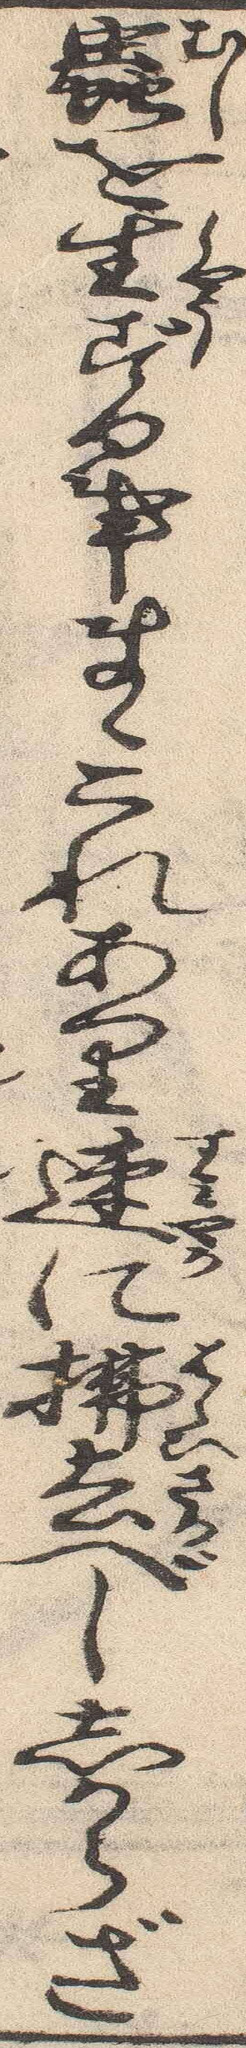蟲を生ずる事まゝこれあり速に拂去べししからざ
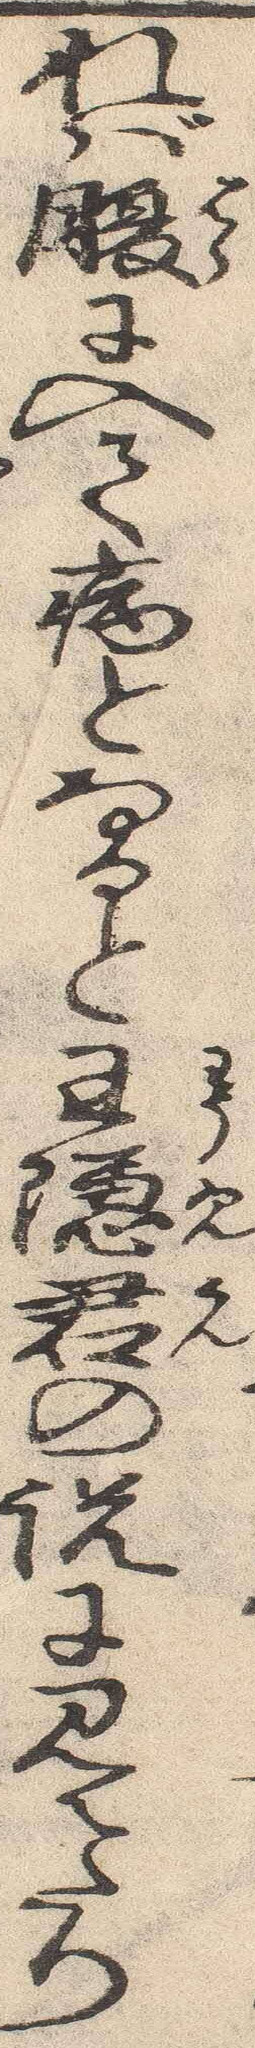れば腹に入て病となると王隠君の説にみえたり
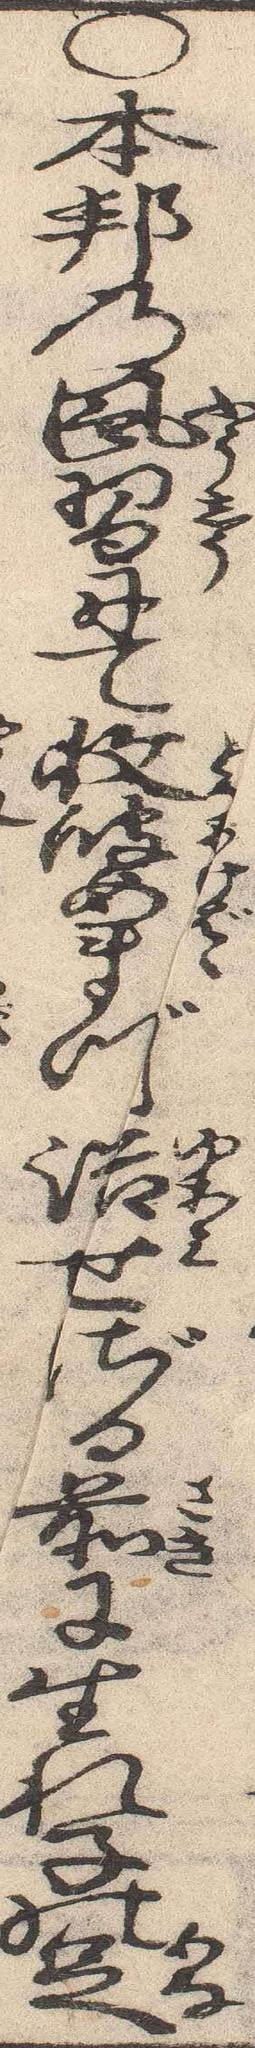◯本邦の風習にて収婆まづ浴せざる前に生れ子の足
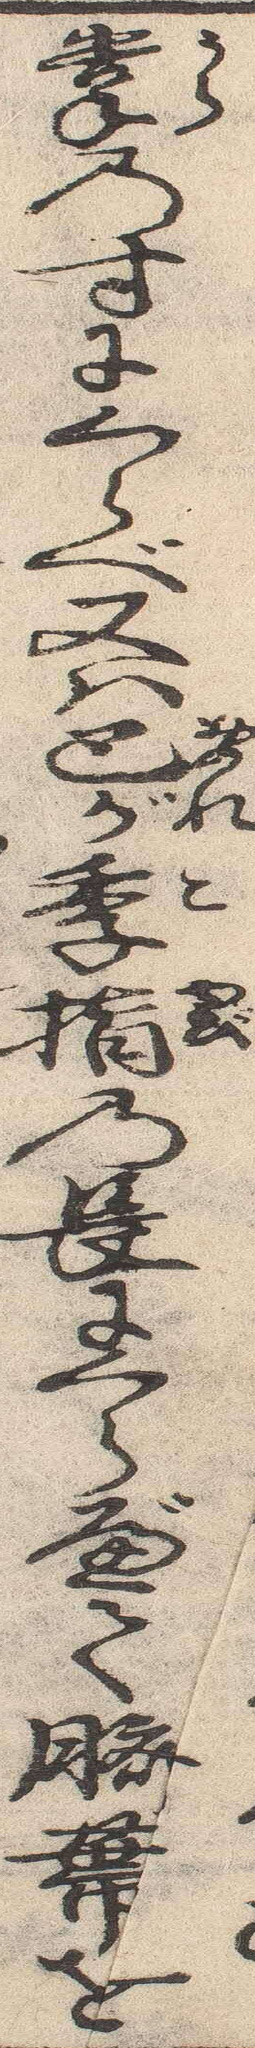掌の寸にくらべ又は己が季指の長にくらべて臍蔕を
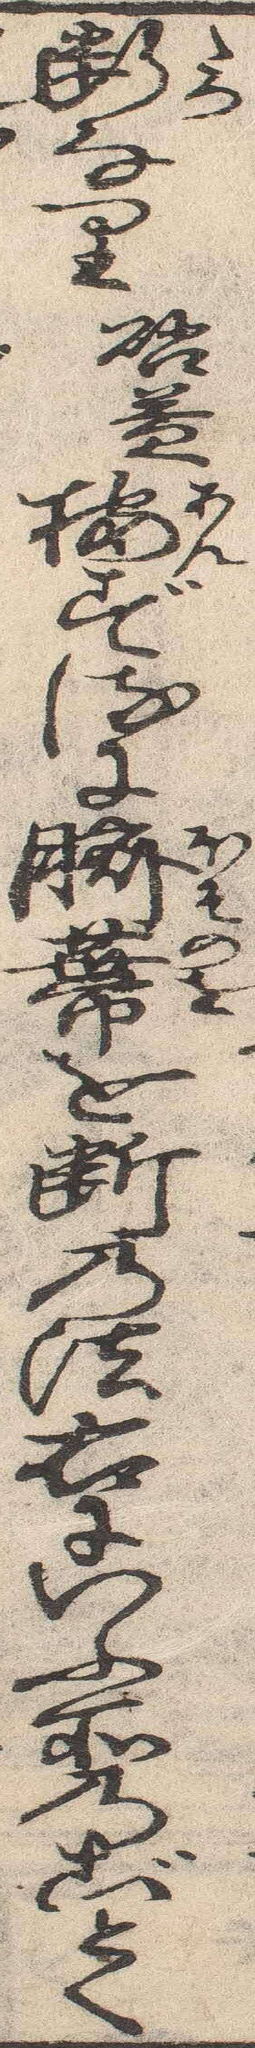断なり啓益按ずるに臍蔕を断の法右にいふ所のごとく
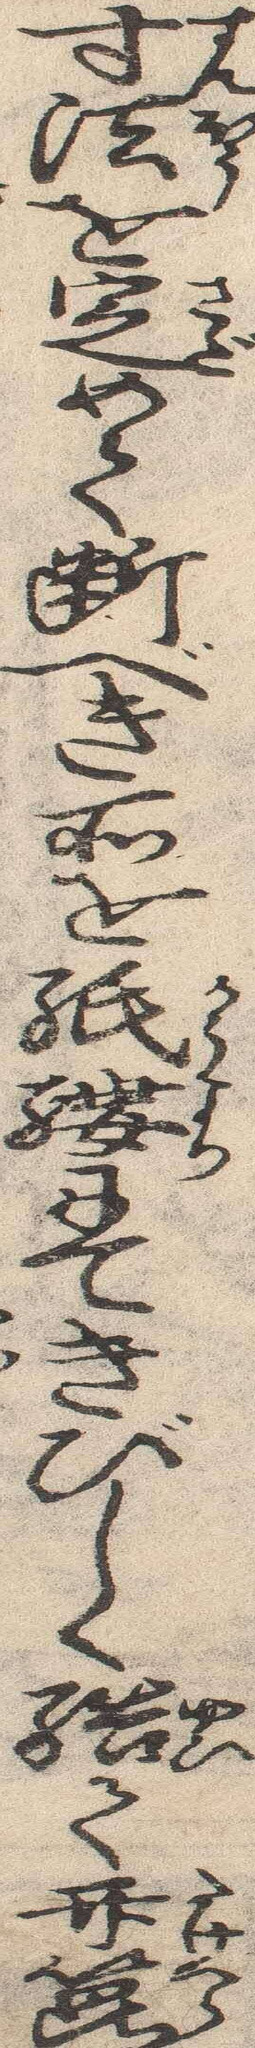寸法を定めて断べき所を紙縷にてきびしく結て竹篦
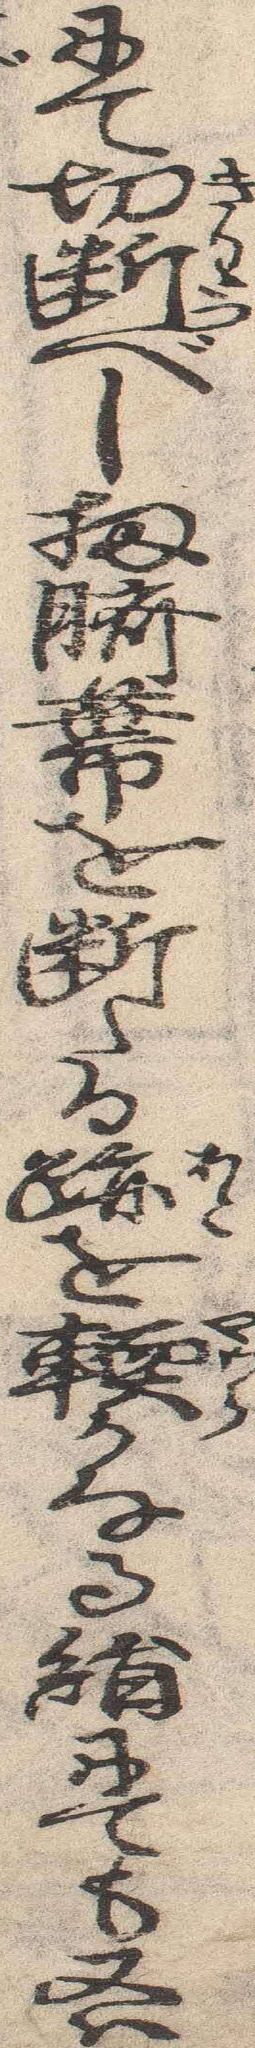にて切断べし扨臍蔕を断たる跡を輭かなる絹にても又は
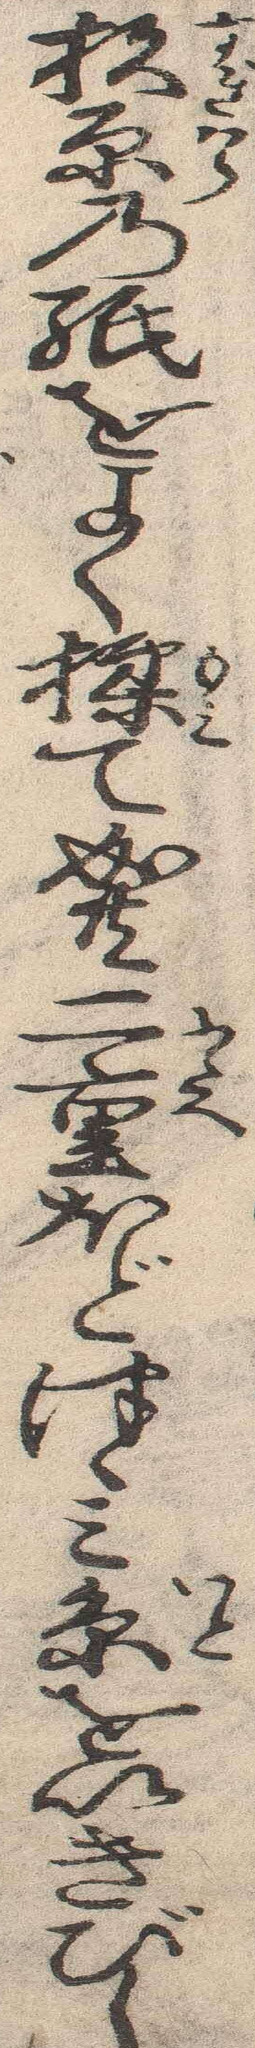杉原の紙をよく揉て成共二重ほどつゝみ糸を以きびし
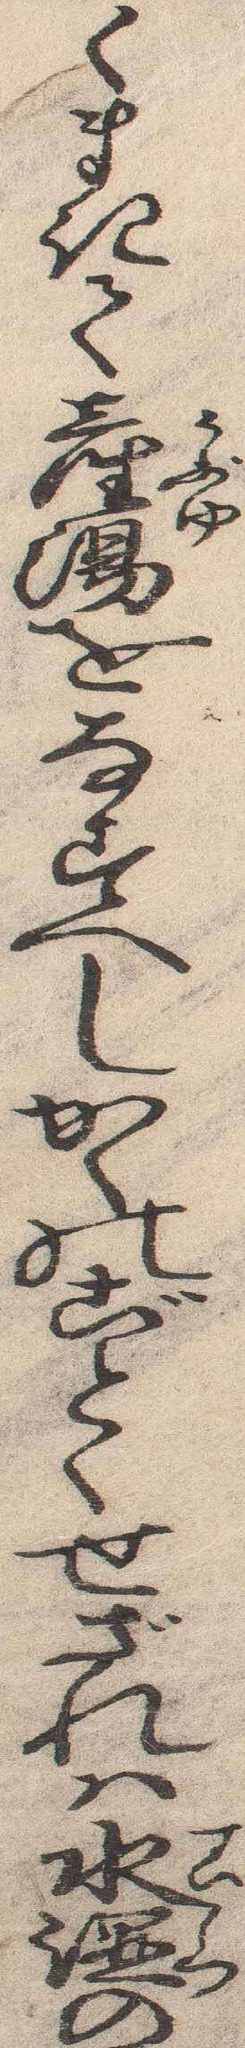くまきて産湯をなすへしかくのごとくせざれは水湿の
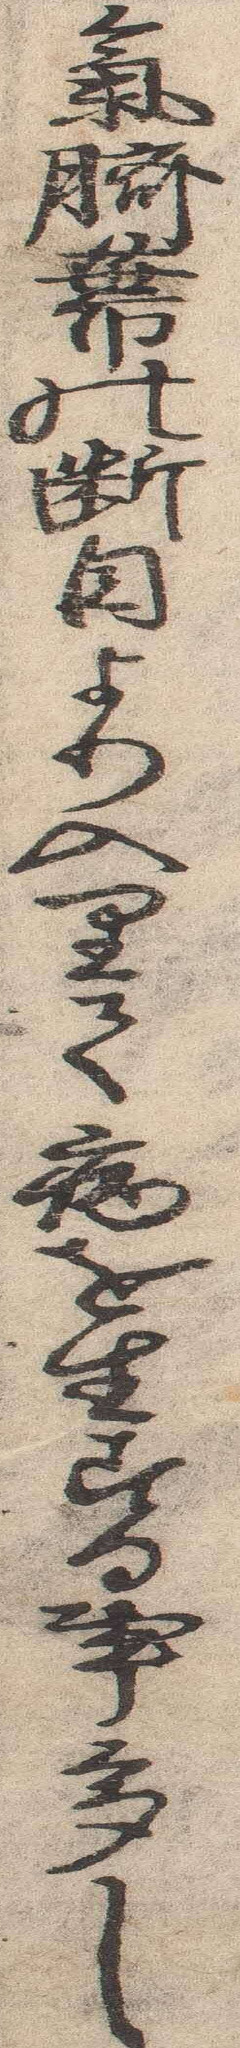氣臍蔕の断目より入りて病を生する事多し

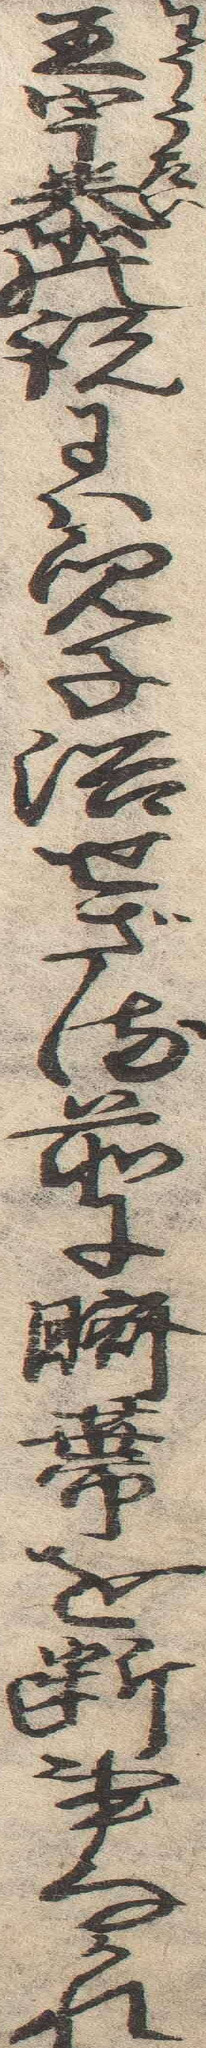王宇泰の説には児子浴せざる前に臍蔕を断ことなかれ
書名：小児必用養育草
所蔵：東京学芸大学附属図書館 国文学研究資料館
